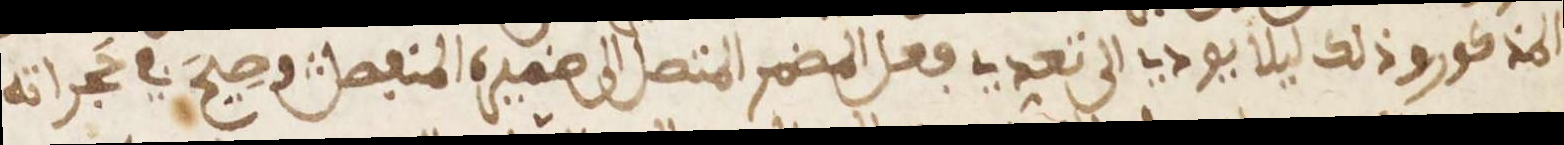المذكور و ذلك ليلا يودي الى تعدي فعل المضمر المتصل الى ضميره المنفصل و صيح في حجراته
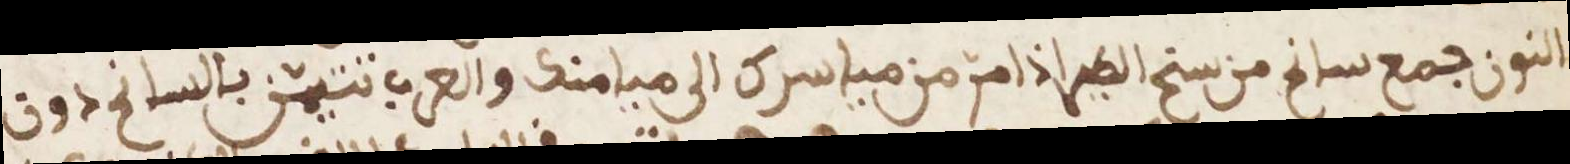النون جمع سانح من سنح الطير اذا مر من مياسرك الى ميامنك و العرب تتيمن بالسانح دون
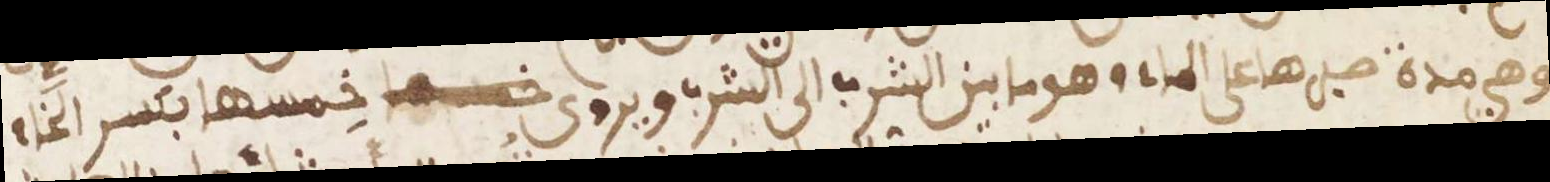و هي مدة صبرها على الماء و هو ما بين الشرب الى الشرب و يروى خمسها بكسر الخاء
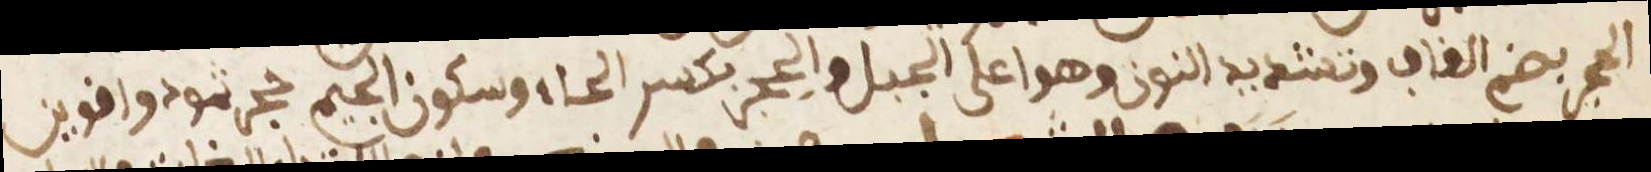الحجر بضم القاف و تشديد النون و هو اعلى الجبل و الحجر بكسر الحاء و سكون الجيم حجر ثمود و اقوين
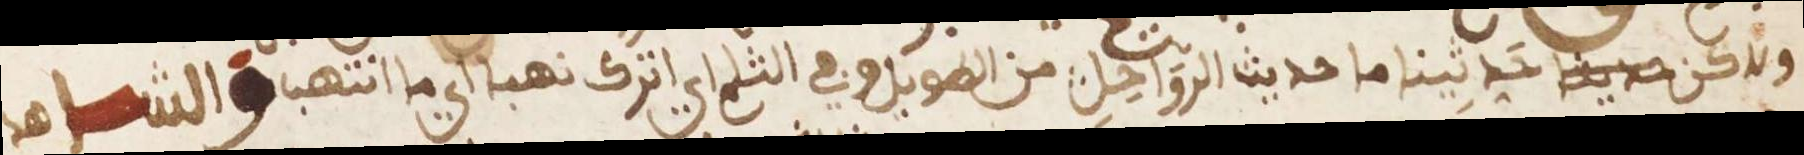و لاكن حدثينا ما حديث الرواحل من الطويل و في الثلم اي اترك نهبا اي ما انتهب و الشاهد
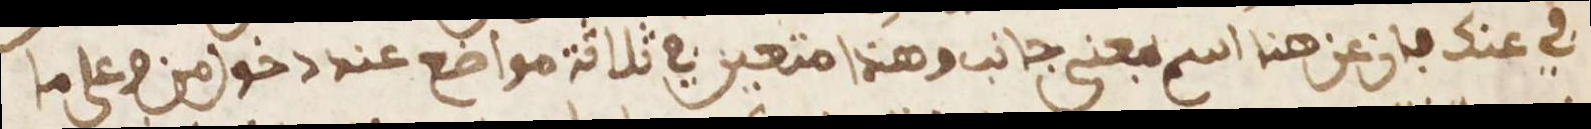في عنك فان عن هنا اسم بمعنى جانب و هذا متعين في ثلاثة مواضع عند دخول من و على ما
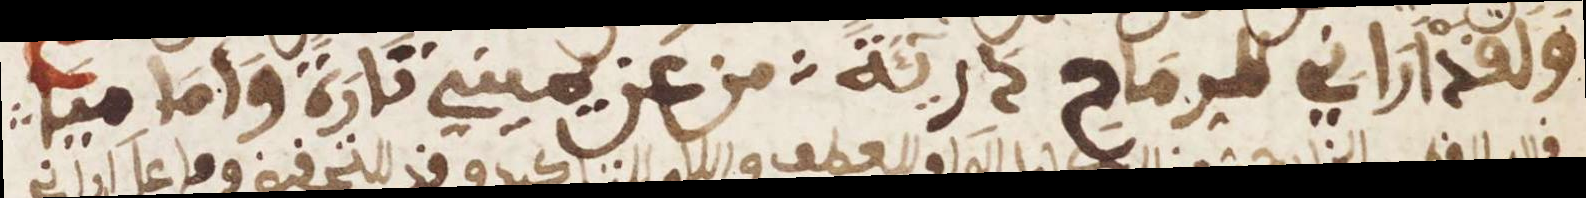و لقد اراني للرماح دريئة من عن يميني تارة و أماميا
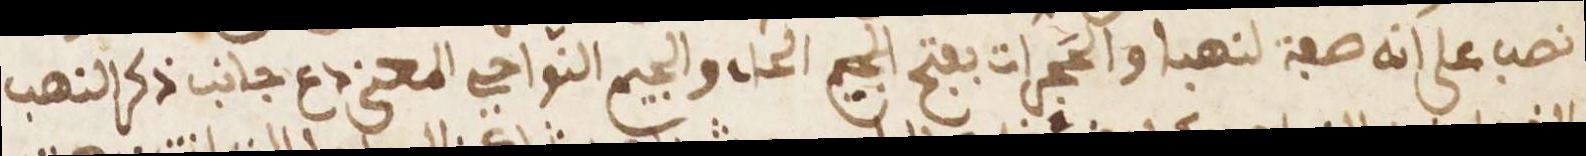نصب على انه صفة لنهبا و الحجرات بفتح الحاء و الجيم النواحي المعنى دع جانب ذكر النهب
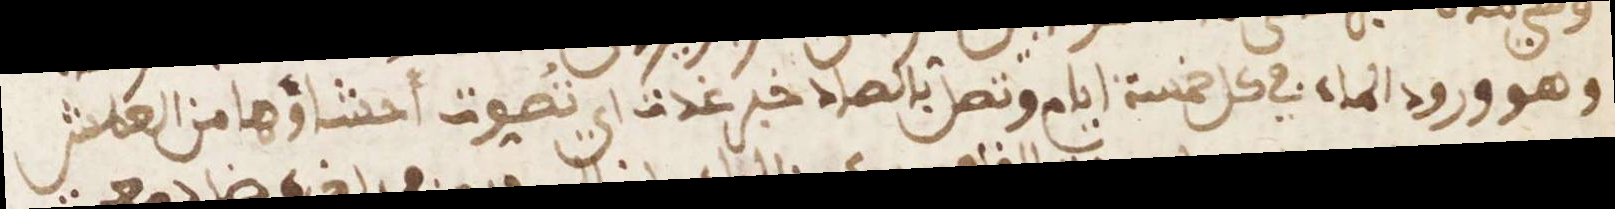و هو ورود الماء في كل خمسة ايام و تصل بالصاد خبر غدت اي تصوت أحشاؤها من العمش
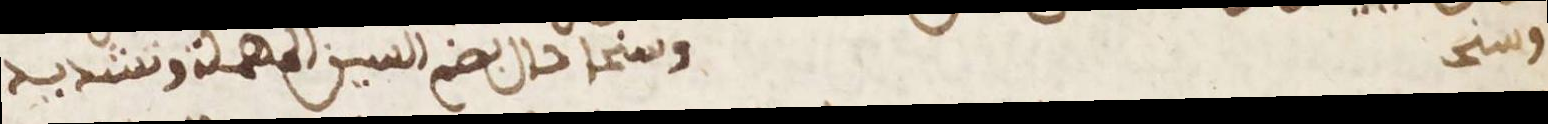و سنح و سنحا حال بضم السين المهملة و تشديد
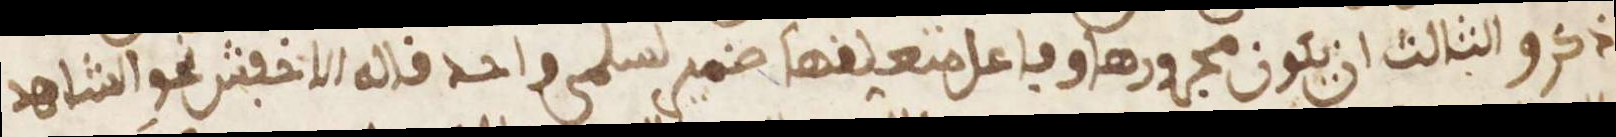ذكرو الثالث ان يكون مجرورها و فاعل متعلقها ضمير لسلمى واحد قاله الاخفش نحو الشاهد
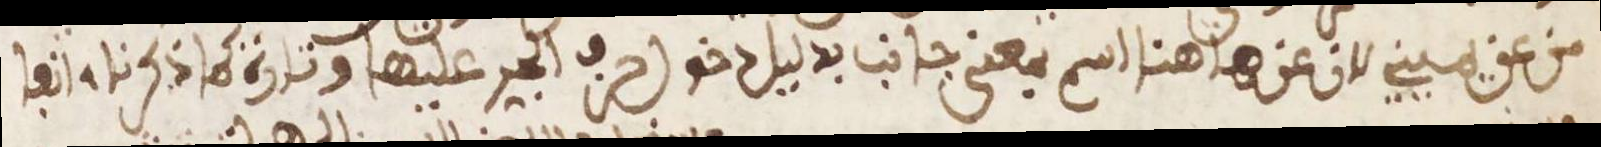من عن يميني لان عن ها هنا اسم بمعنى جانب بدليل دخول حرف الجر عليها و تارة كما ذكرنا ءانفا
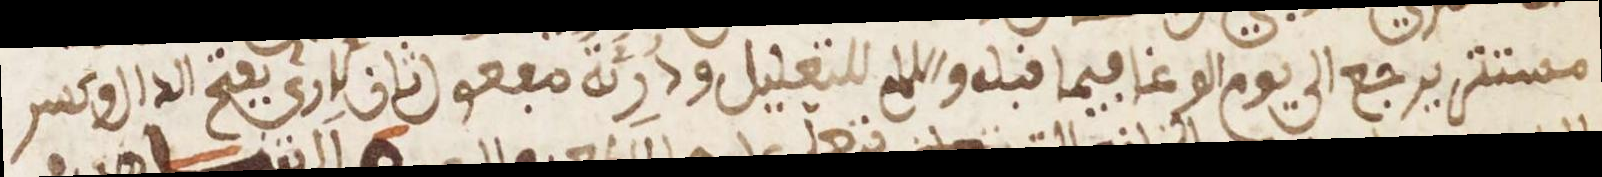مستتر يرجع الى يوم الوغا فيما قبله و اللام للتعليل و درئة مفعول ثان لارى بفتح الدال و كسر
